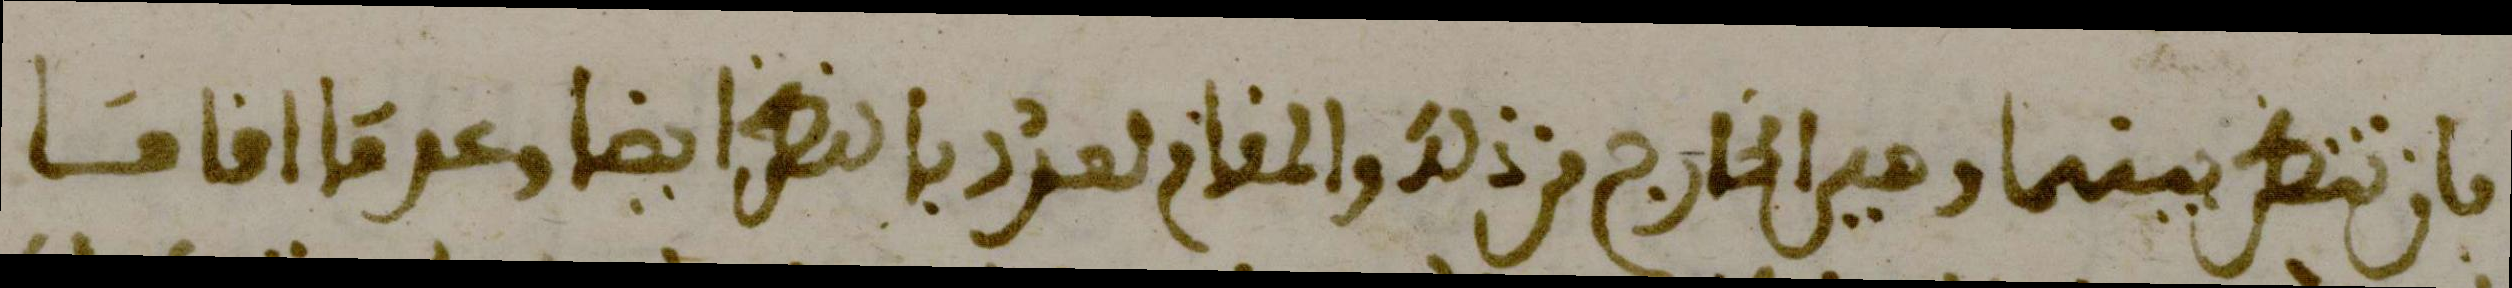بان تنظر بينها وصير الخارج من ذلك والمقام لعدد بالنظر ايضا وعد مَا اقامَا
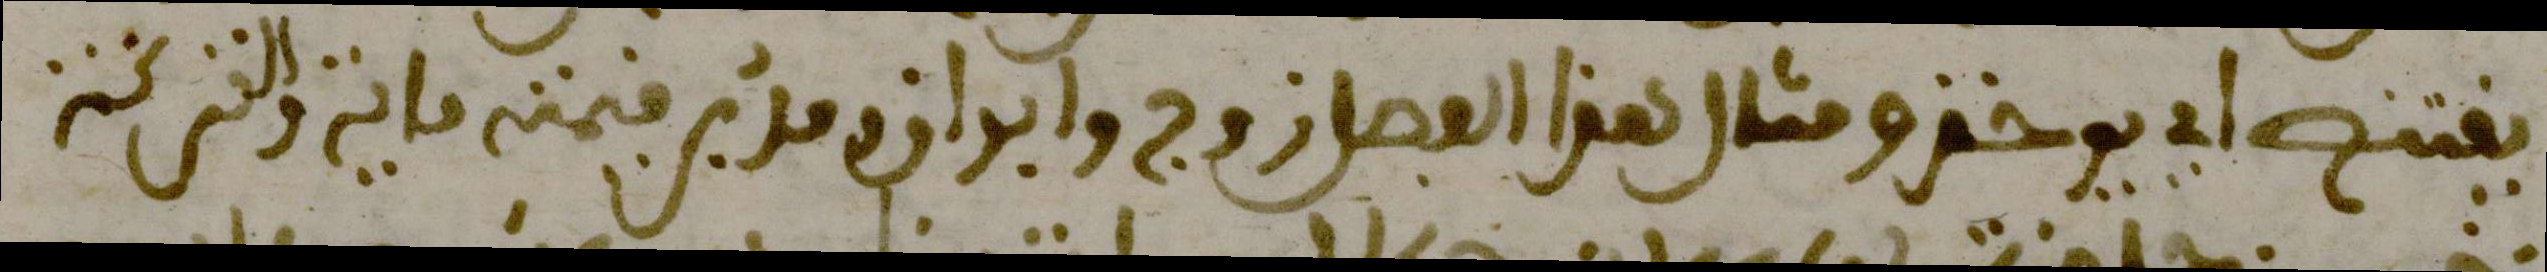يقتنص اي يوخذ ومثال هذا الفصل زوج وابوان ومدبر قيمته ماية والتركة
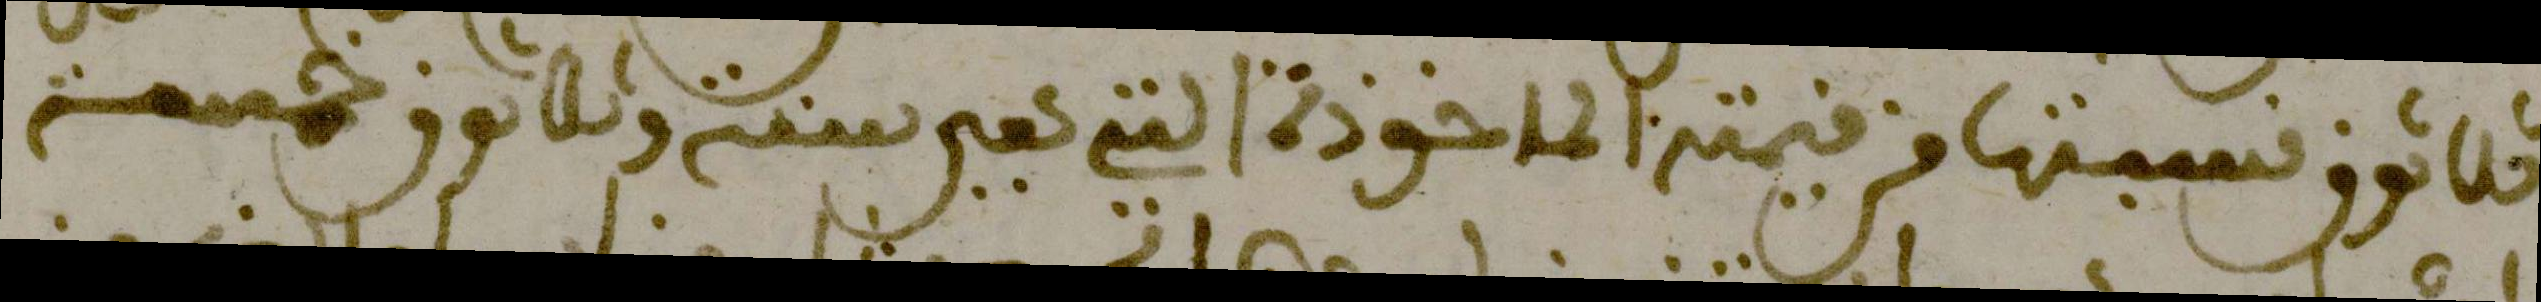ثلاثون ونسبتها من قيمة الماخوذة التي هي ستة وثلاثون خمسة
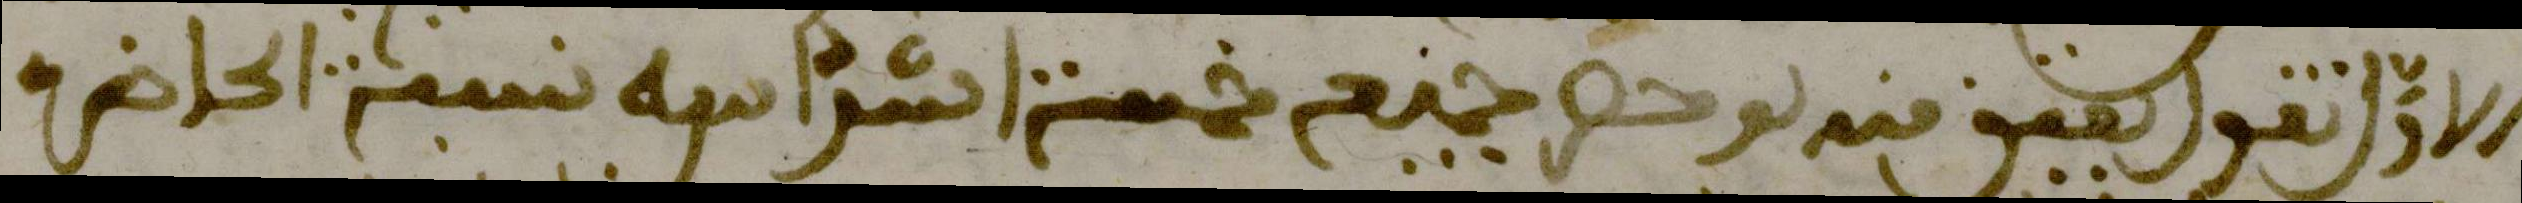الاوّل تقول يعتق منه لو حضر جميعه خمسة اسْداسه نسبة الحاضر
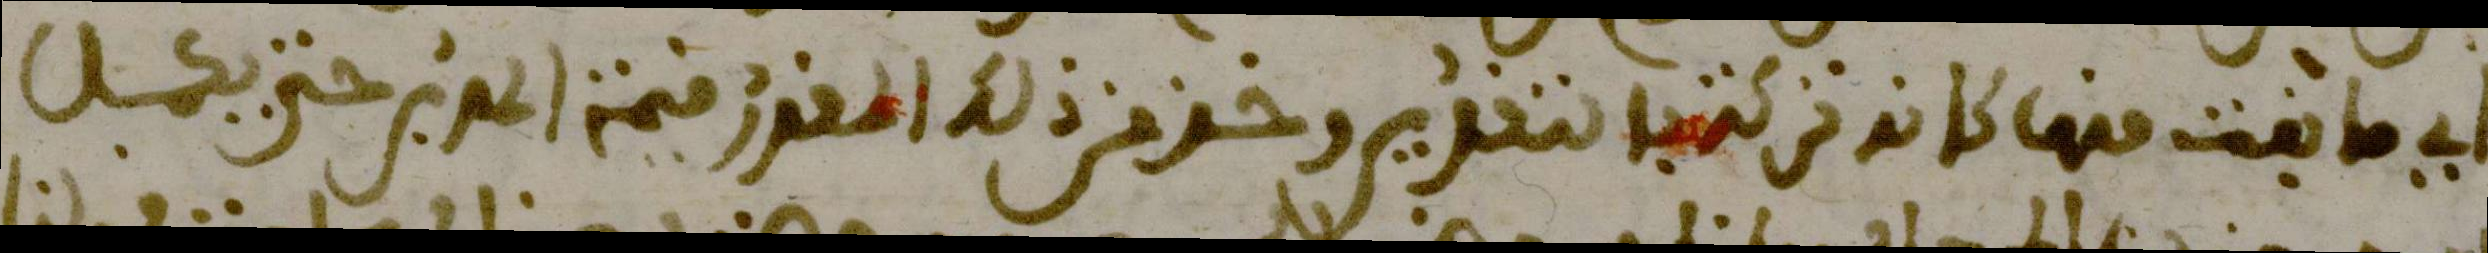اي ما ثبت منها كانه تركة بالتقدير وخذ من ذلك المقدر قيمة المدبر حتى يكمل
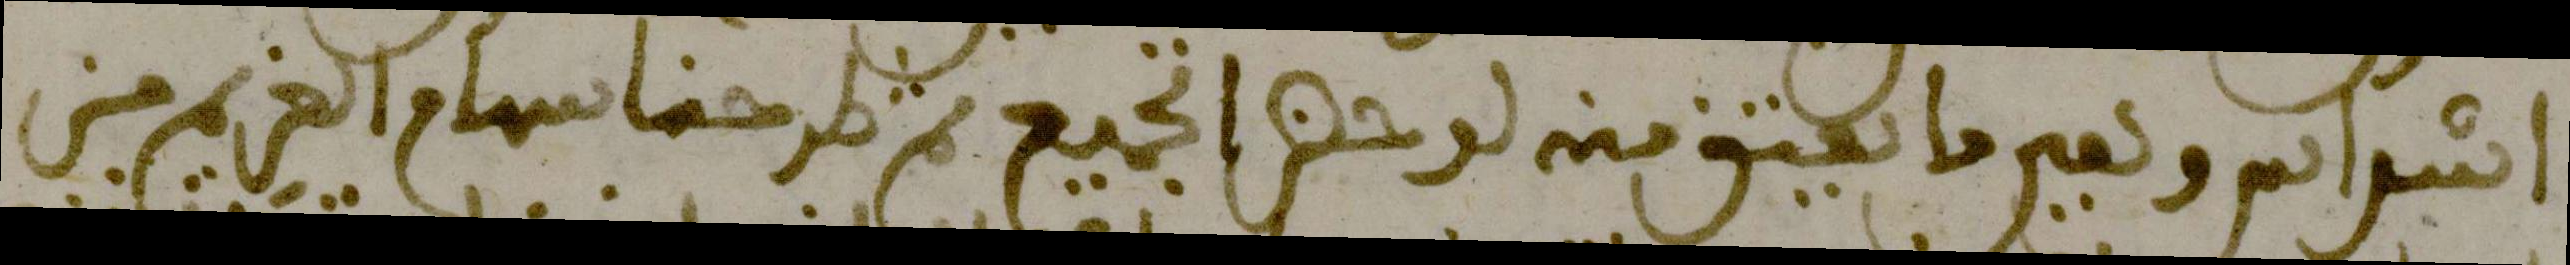اسْداس وهي ما يعتق منه لو حضر الجميع ثم طرحنا سهام الغريم من
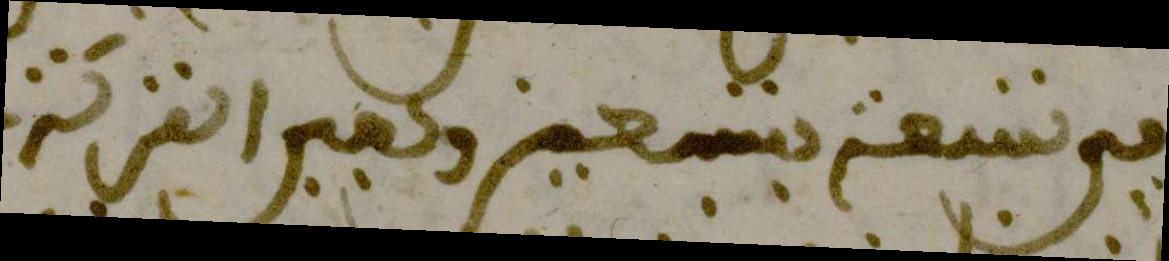في تسعة بتسعين وهي التركة
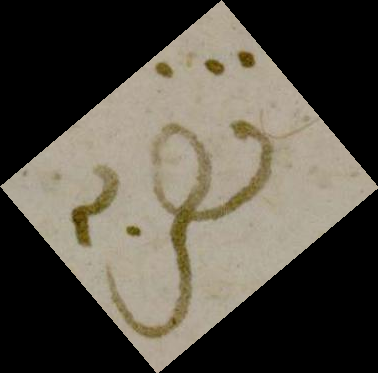تضرب
